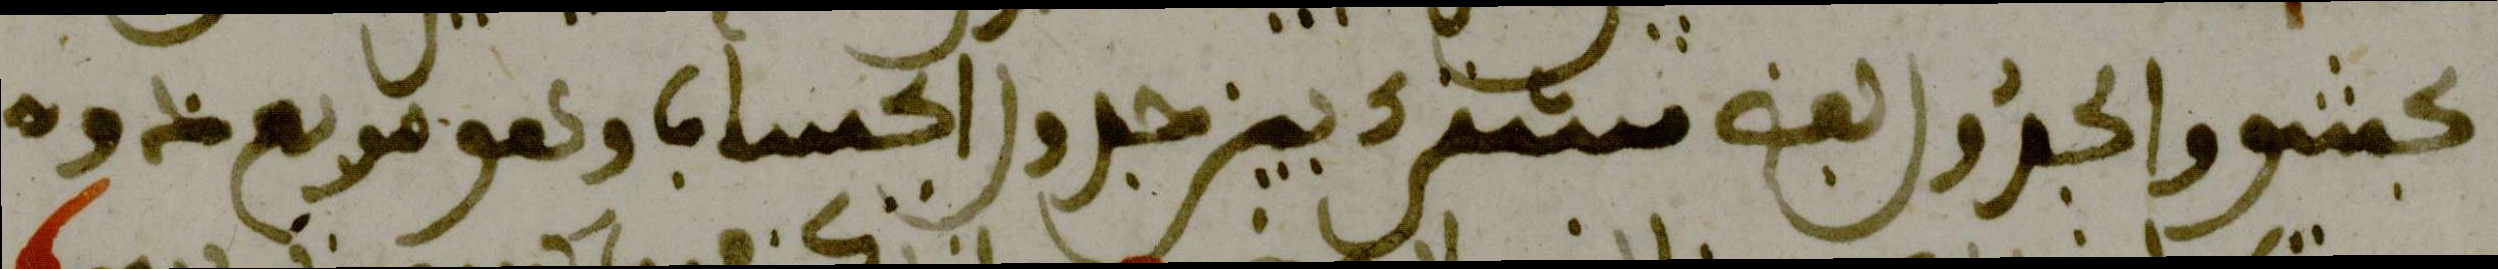بمحشو والجدول لفظ مشترك بين جدول الحساب وهو مربع ذو
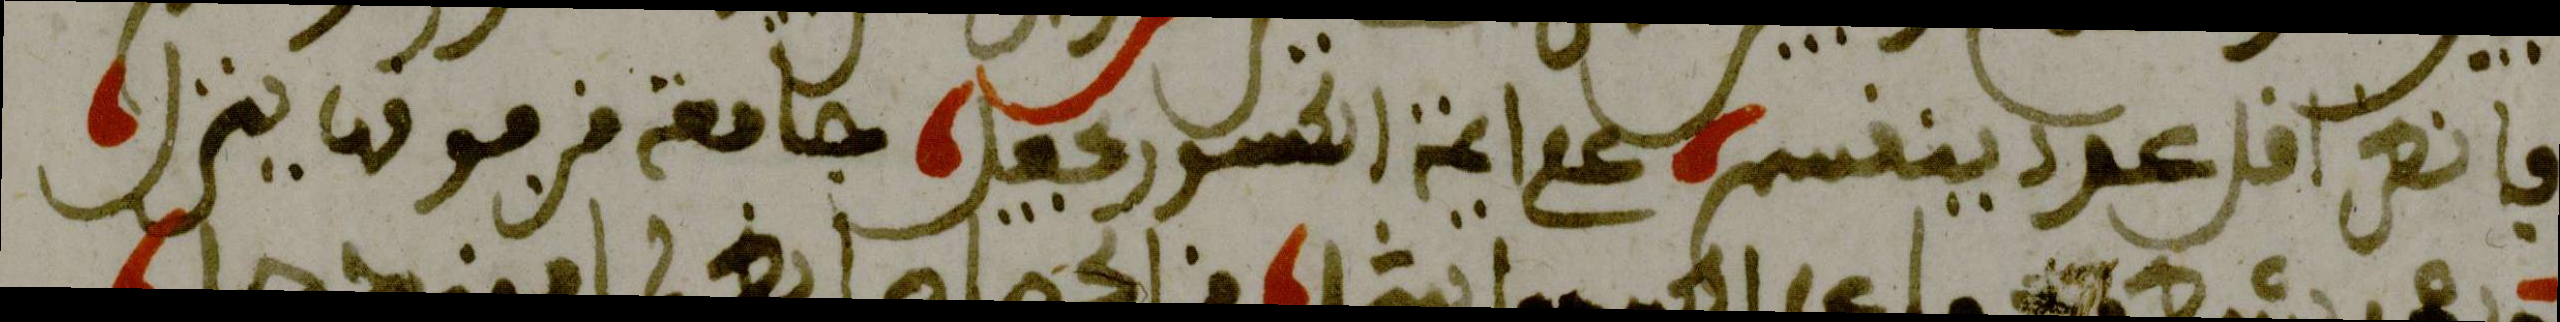فانظر اقل عدد ينقسم على ايمة الكسور يجعل جامعة من قولها ينزل
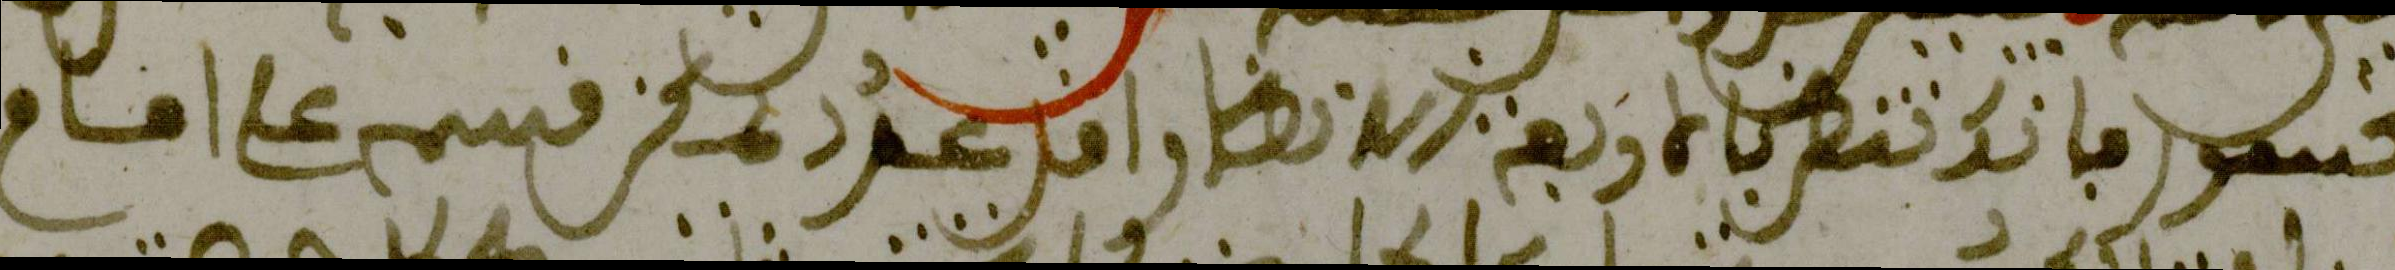كسور فانك تنظر بالاربعة الانظار واقل عدد يمكن قسمه على امام
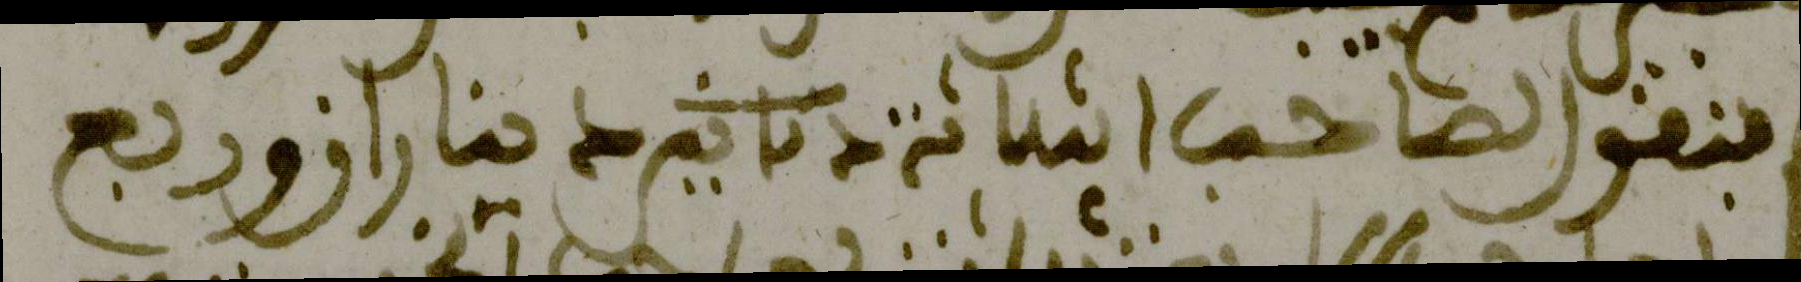فتقول لصاحب الثلاثة دنانير ديناران وربع
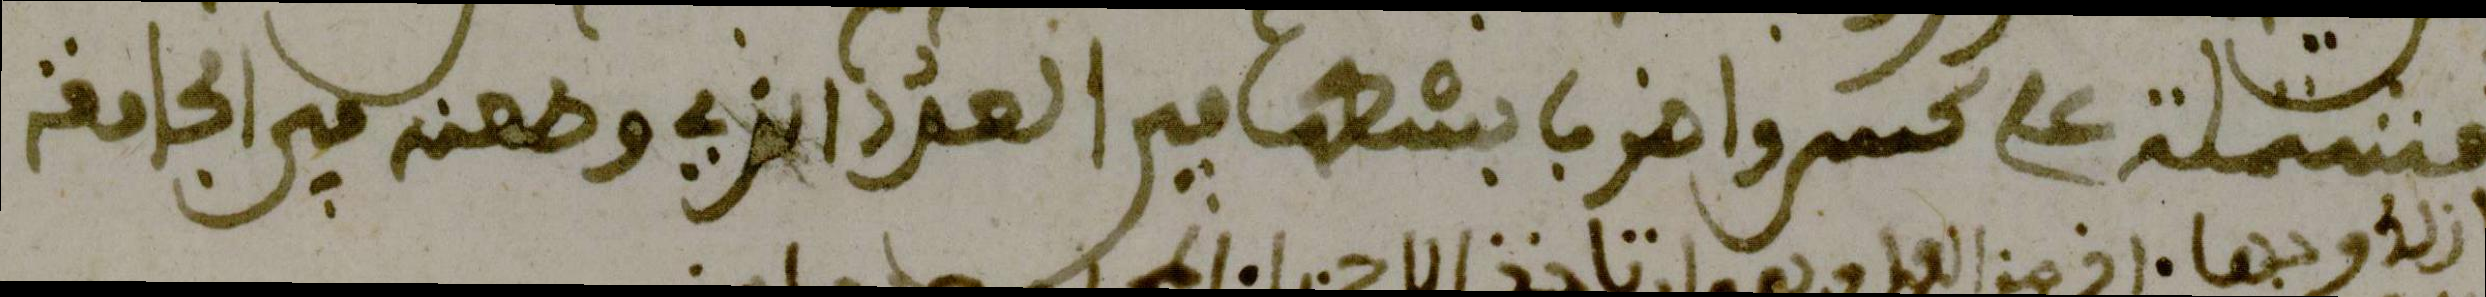مشتملة على كسر واضرب بسْطها في العدد الذي وضعته في الجامعة
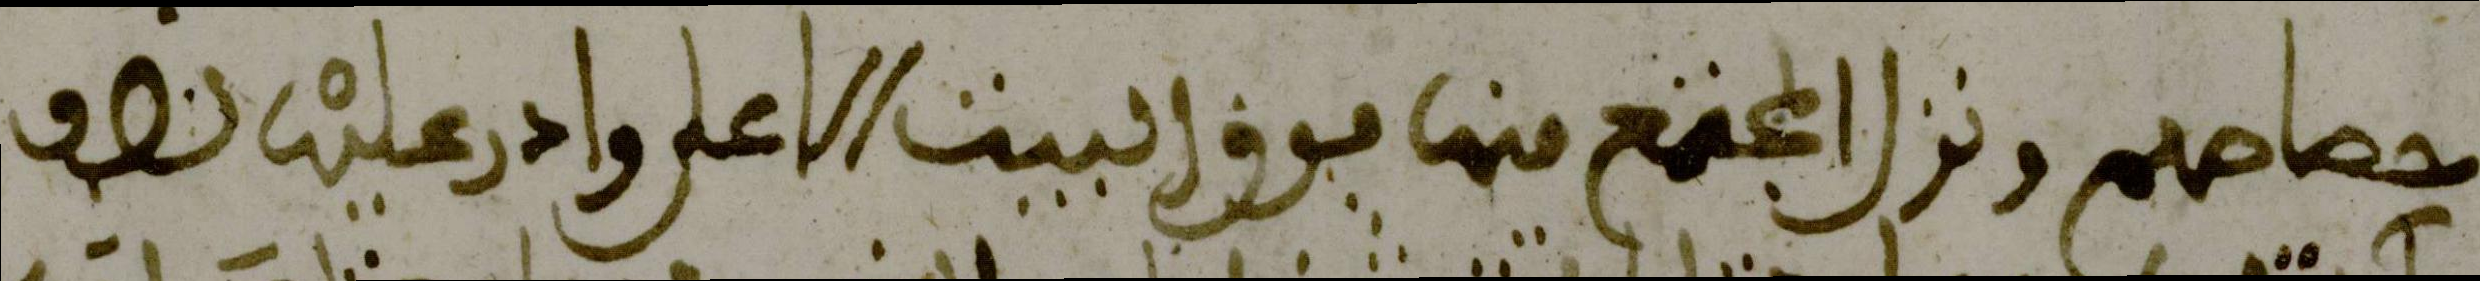حصاصهم وانزل المجتمع منها فوق البيت الاعلى وادر عليْه نصف
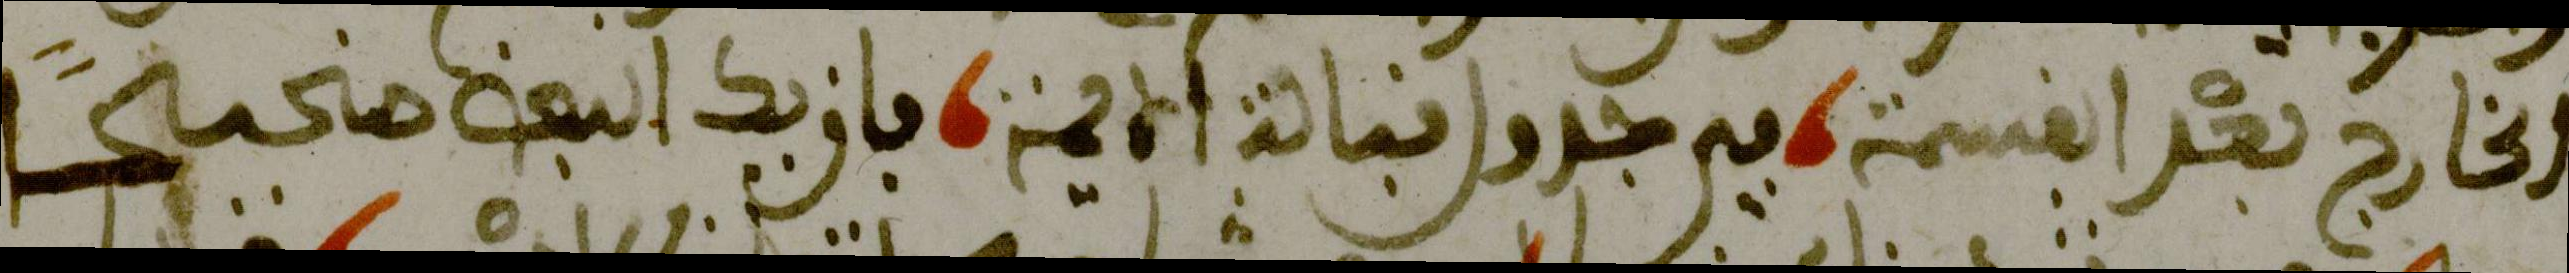الخارج بعْد القسمة في جدول قبالة الايمة فان يك البعض صحيحًا
